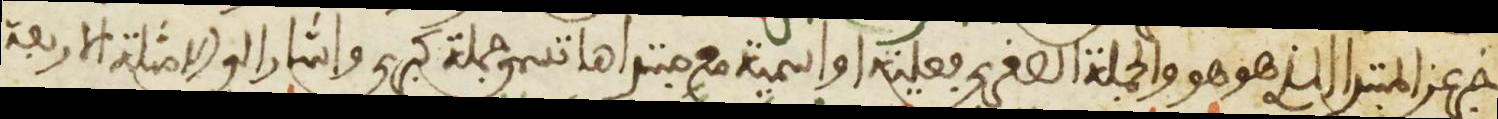خبرعن المبتدا الذى هو هو والجملة الصغرى فعلية او اسمية مع مبتداها تسمى جملة كبرى و اشار الى الامثلة الاربعة
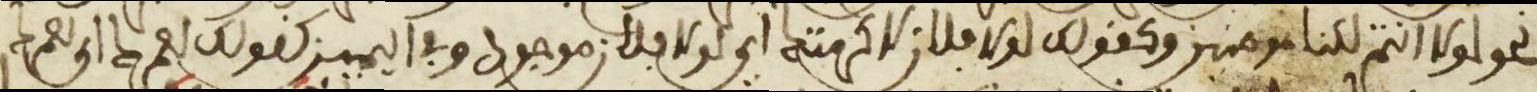نحو لولا انتم لكنا مومنين و كقولك لولا فلان لاكرمتك اي لولا فلان موجود و فى اليمين كقولك لعمرك اى لعمرك
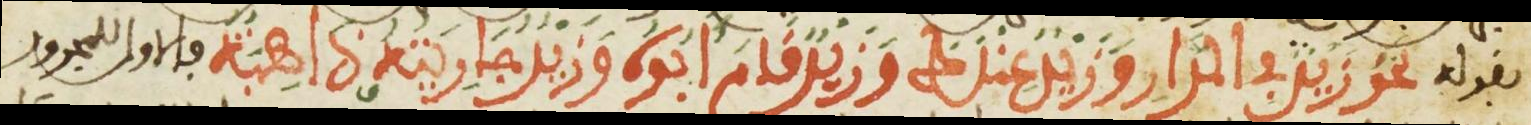بقوله نحو زيد فى الدار و زيد عندك و زيد قام ابوه و زيد جاريته ذاهبة فالاول للمجرور
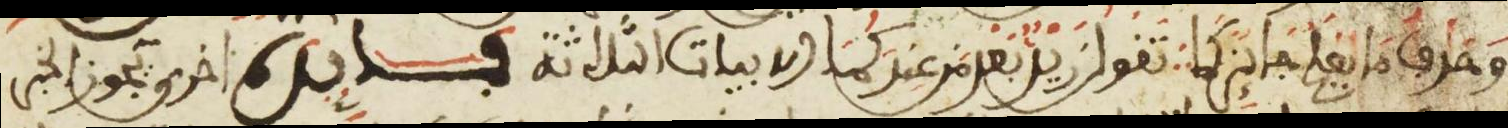حذف ما يعلم جائز كما تقول زيد بعد من عندكما الابيات الثلاثة فائدة اخرى و يجوز الخبر
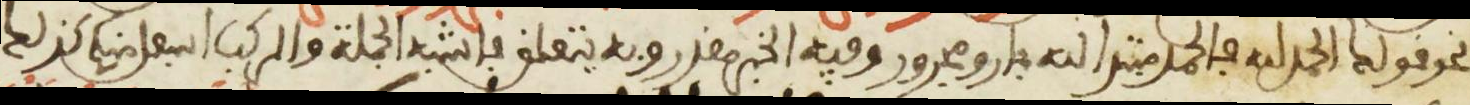نحو قولك الحمد لله فالحمد مبتدا لله جار ومجرور و فيه الخبر مقدر و به يتعلق فاشبه الجملة و الركب اسفل منكم كذلك
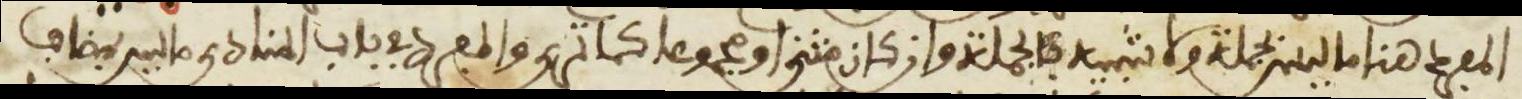لمفرد هنا ما يسمى بجملة ولا شبيه بالجملة و ان كان مثنى او مجموعا كما ترى و المفرد فى باب المنادى ما ليس بمضاف
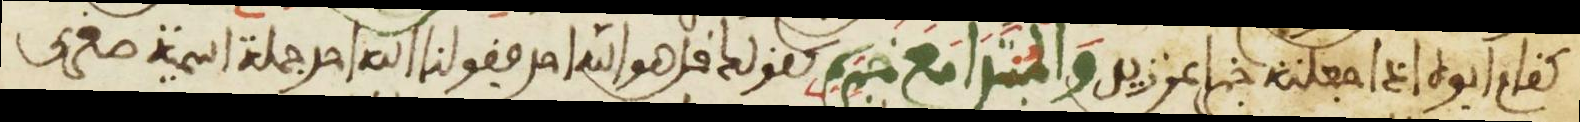كقام ابوه اذا جعلته خبرا عن زيد و المبتدا مع خبره كقولك قل هو الله احد فقولنا الله احد جملة اسمية صغرى
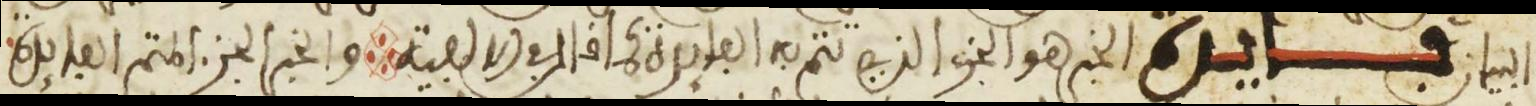البيان فايدة الخبر هو الجزء الذي تتم به الفائدة كما قال فى الالفية و الخبر الجزء المتم الفائدة
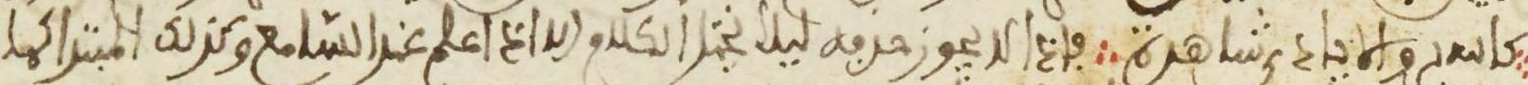كالله بر و الايادى شاهدة فاذا لا يجوز حذفه ليلا يختل الكلام الا اذا علم عند السامع و كذلك المبتدا كما
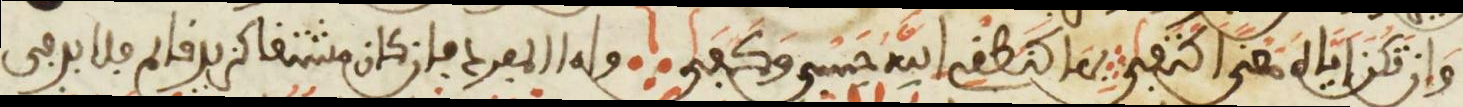وان تكن إياه معنى اكتفى بما كنطقى الله حسبى وكفى و له المفرد فان كان مشتقا كزيد قا ئم فلا بد فى
